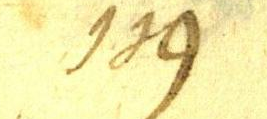119
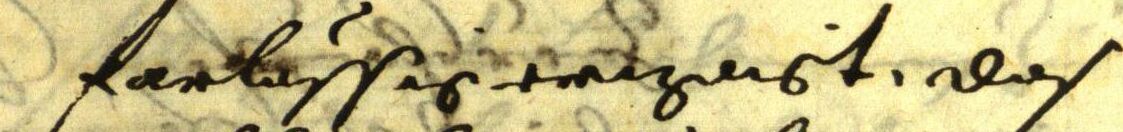farlāssig erzaigt. das¬
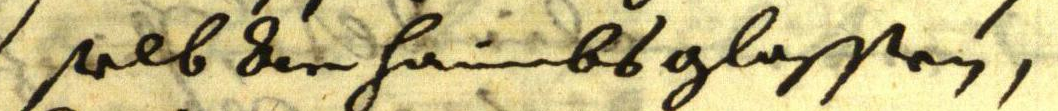selb An haimbs glassen,
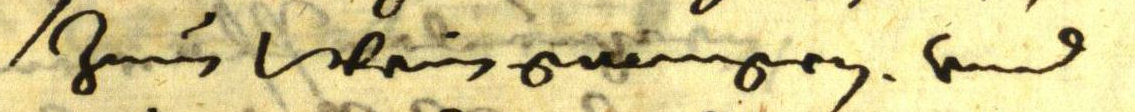Zūm Wein ganngen. vnd
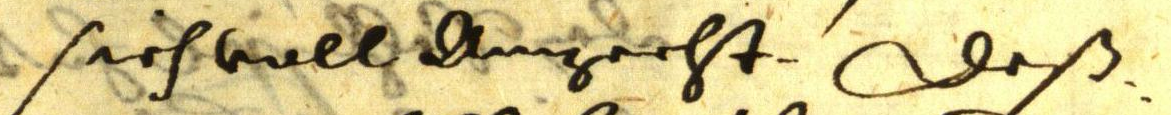sich voll Anzecht. Deß¬
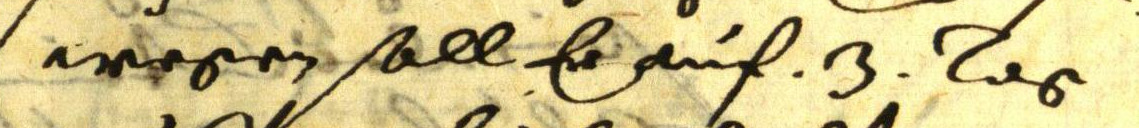wegen soll Er aūf .3. Tag
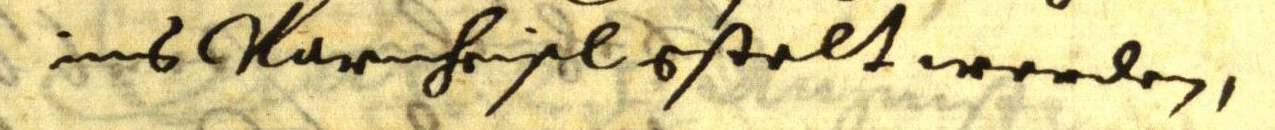ins Narnheisl gstelt werden,
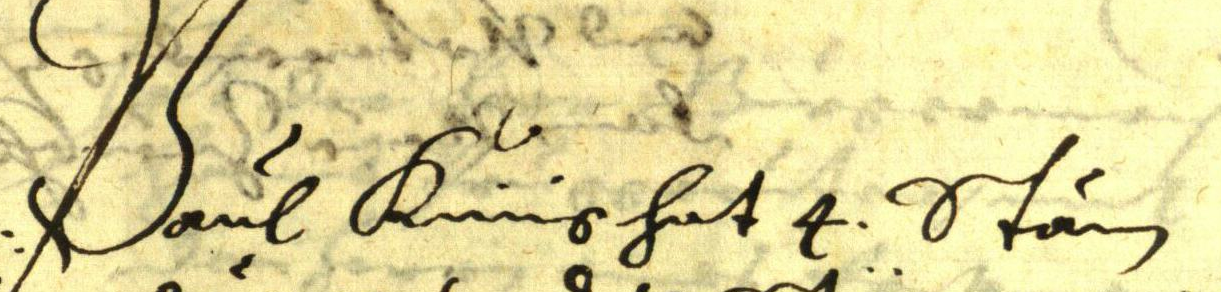Paūl Kinig hat 4. Stām
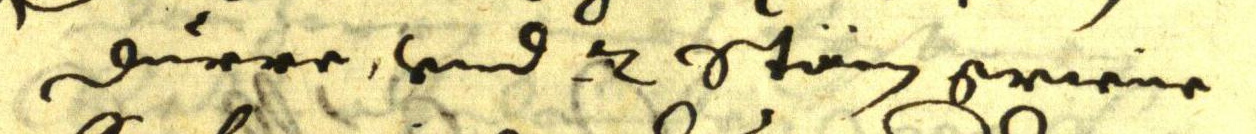dūrre, vnd 2 Stäm griene
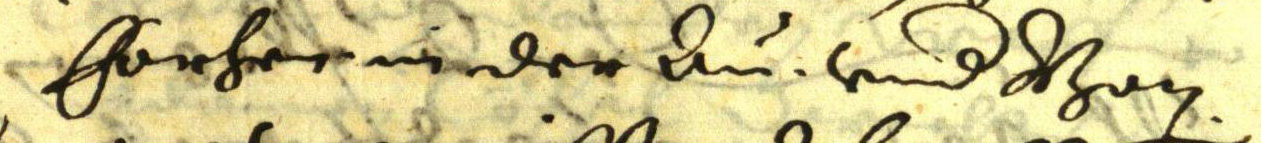Forhre in der Aū. vnd Boz.
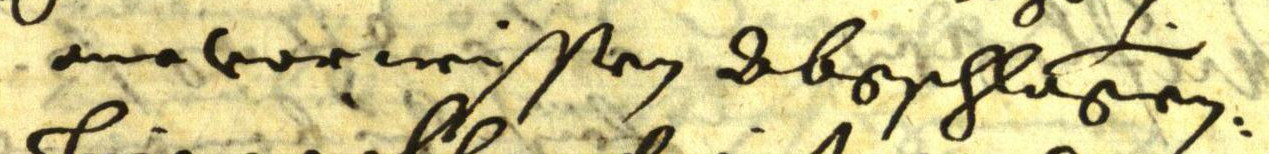one vorwissen Abgschlagen¬
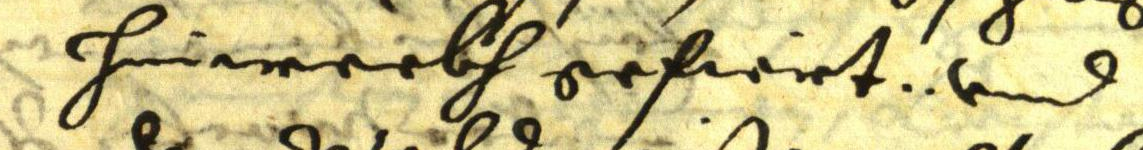hinweckh gefiert: vnd
